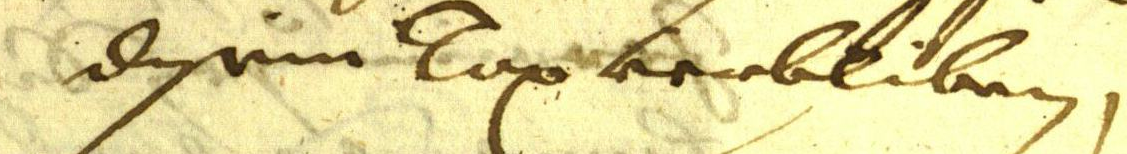disem Tax verbliben,
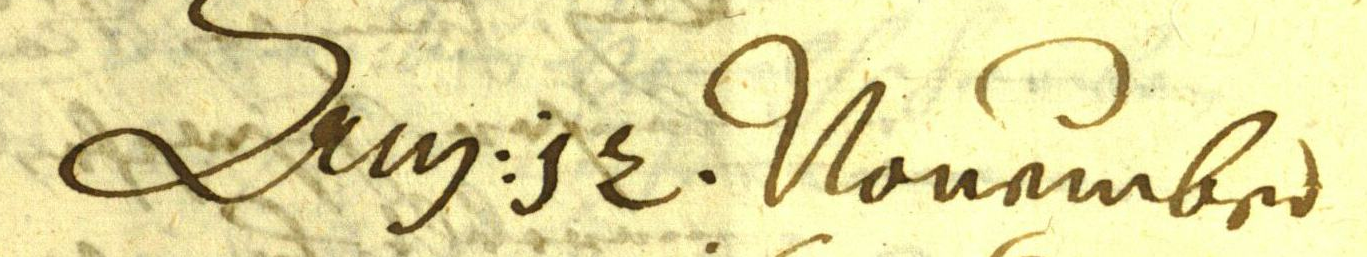Am: 12. Noūember
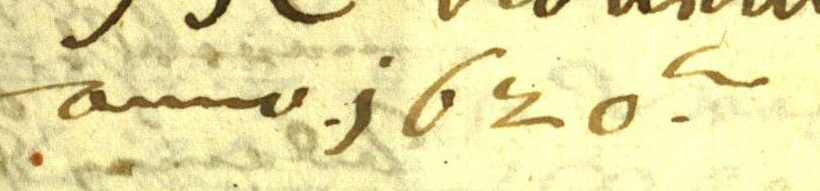Anno .1620.t
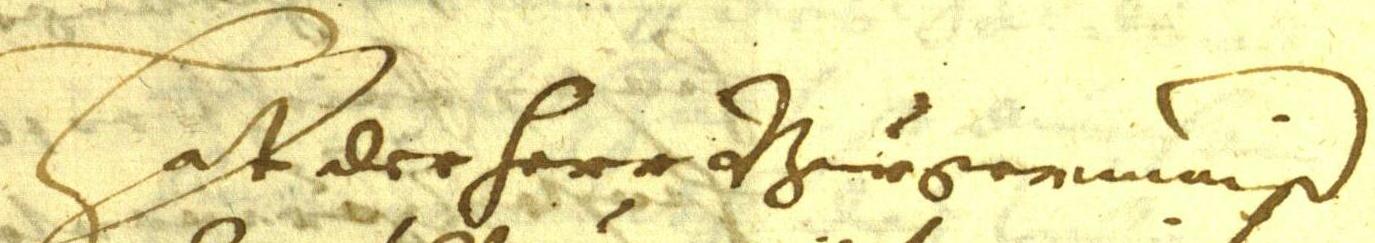Hat der herr Būrgermaist
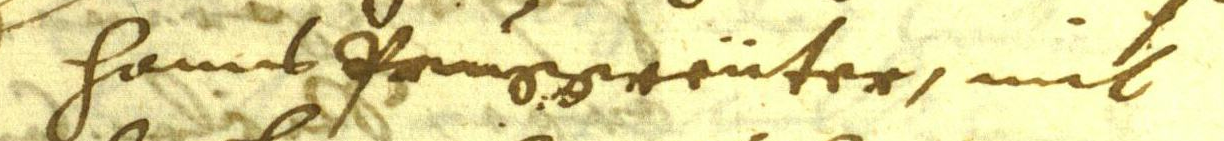hanns Prūggreüter, mit
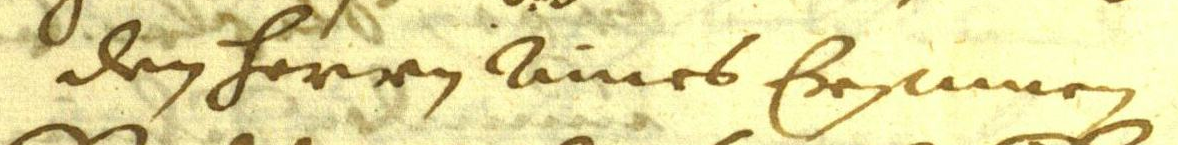den herrn Aines Ersamen
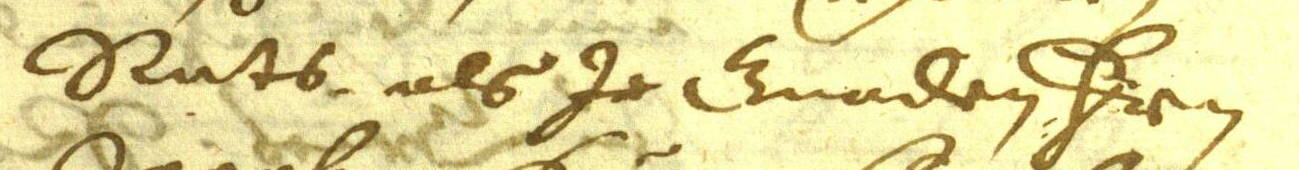Rats. als Ir Gnaden hrn
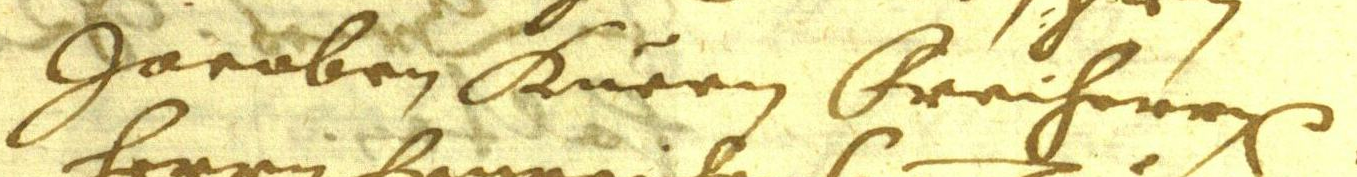Jacoben Kūeen Freiherrn etc.
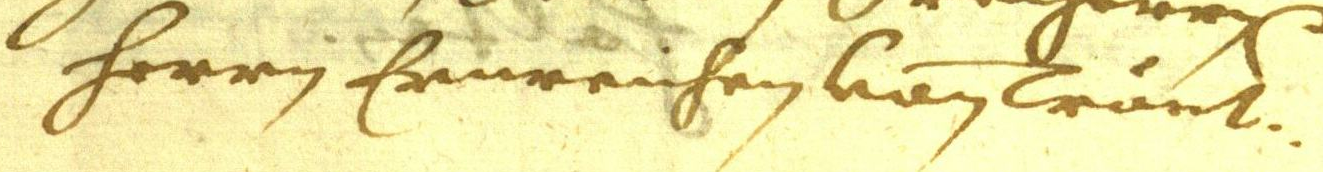herrn Ernreichen von Traūt¬
